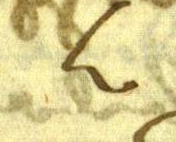t
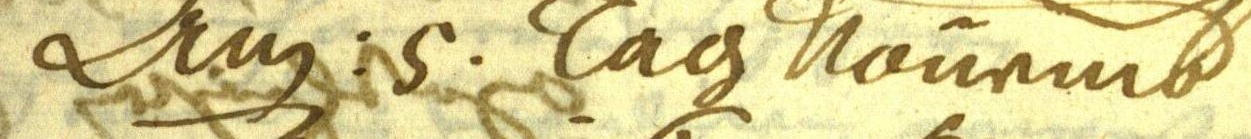Am: 5. Tag Noūemb
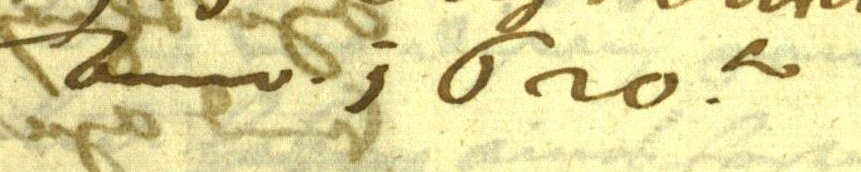Anno .1620.t
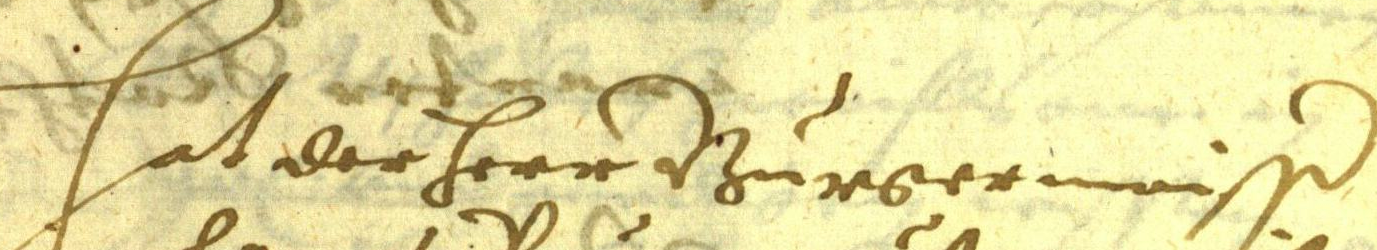hat der herr Būrgermaisst
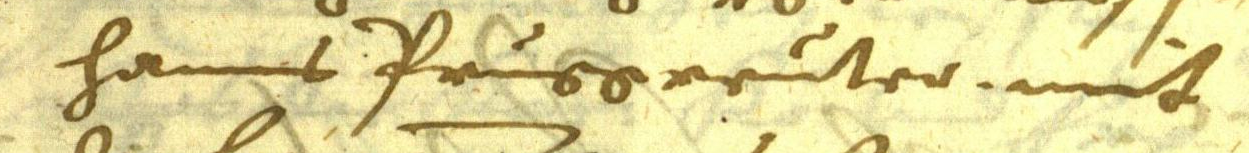hanns Prūggreūter. mit
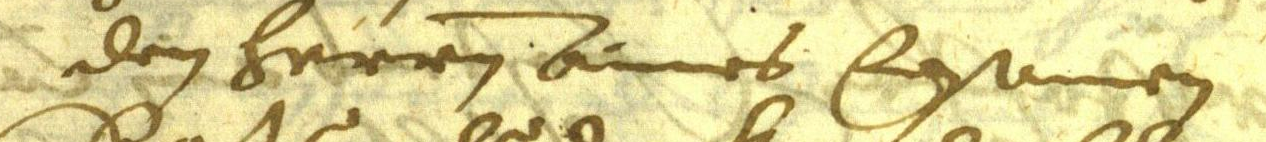den herrn Aines Ersamen
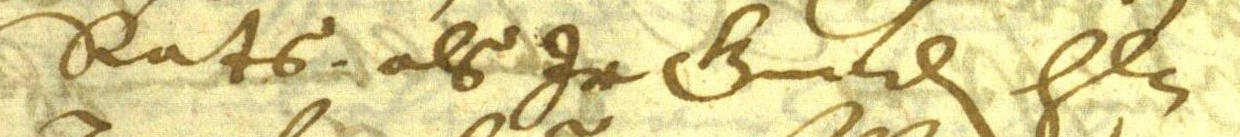Rats. als Ir Gnad hln
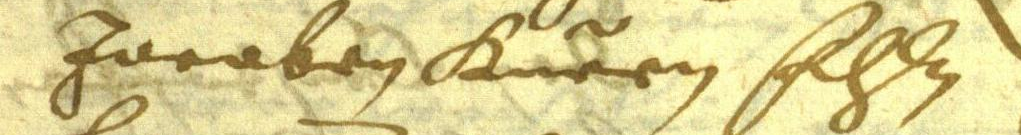Jacoben Kūeen Fhn etc.
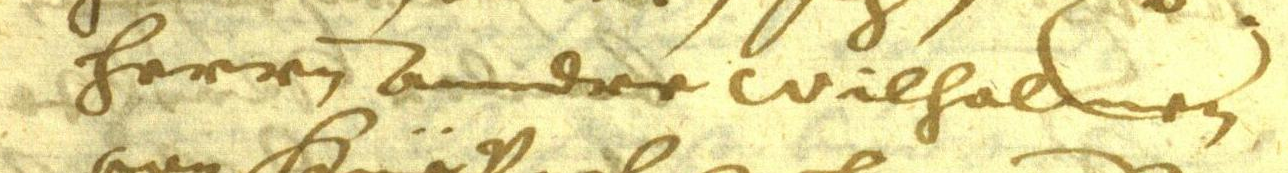herrn Anndre Wilhalmen
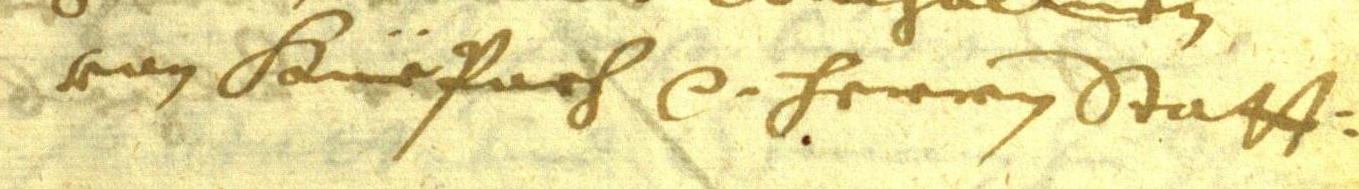von KüePach etc. herrn Statt¬
